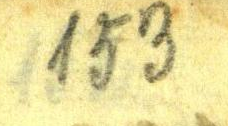153
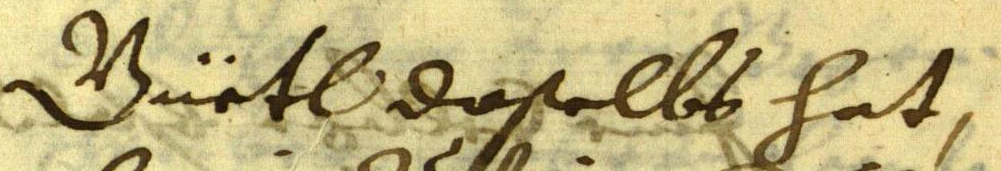Güetl daselbs hat,
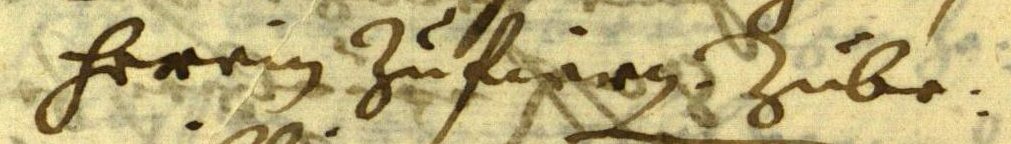herein Zū fiern. Zūbe¬
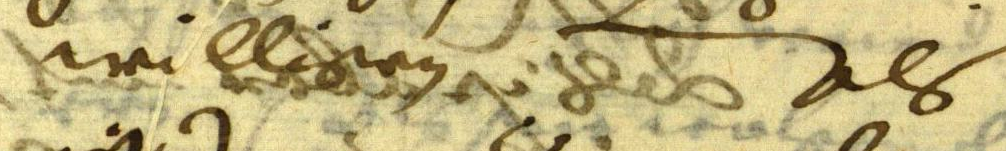willigen. Als
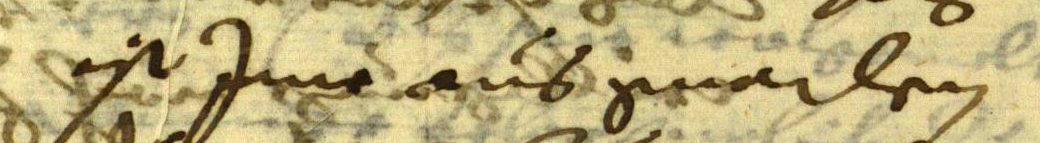ist Ime aūs gnaden
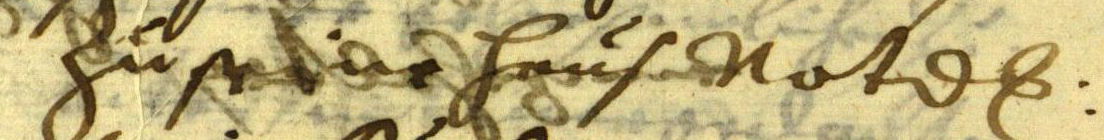Zū seine haūs Notd:
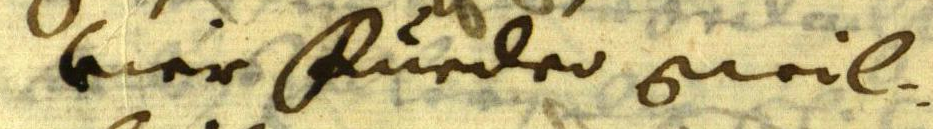vier Fūeder gwil¬
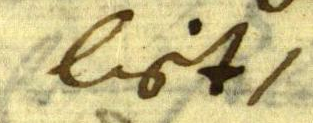ligt.
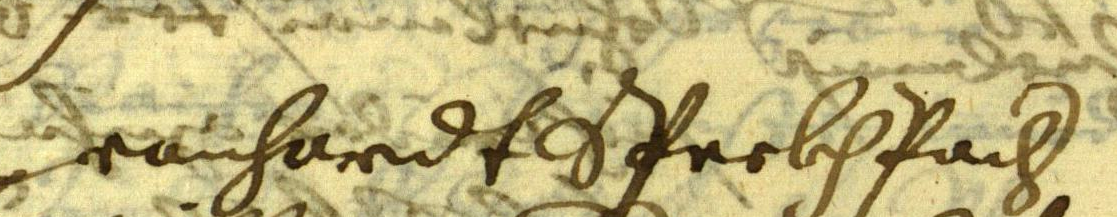Leonhardt SpeckhPach
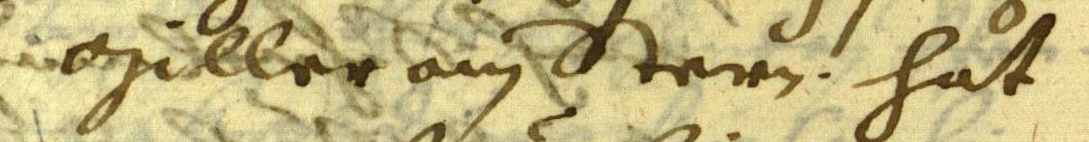Miller am Stern. hat
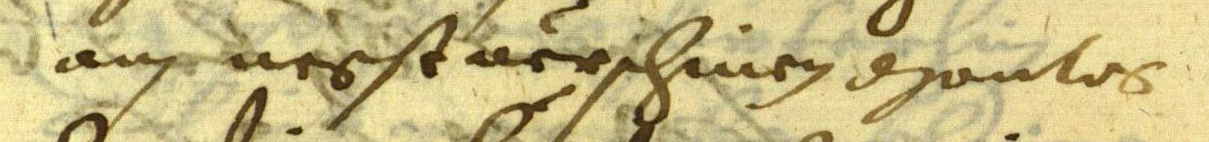am negst ūerschinen Montag
